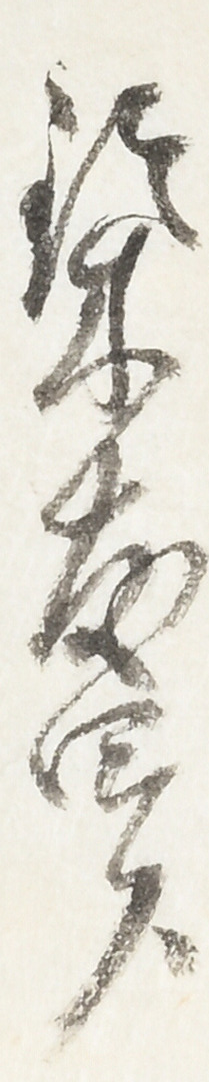鈴木藤四郎
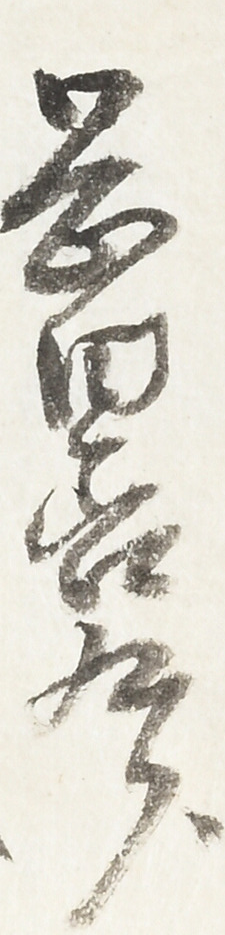岡田善九郎
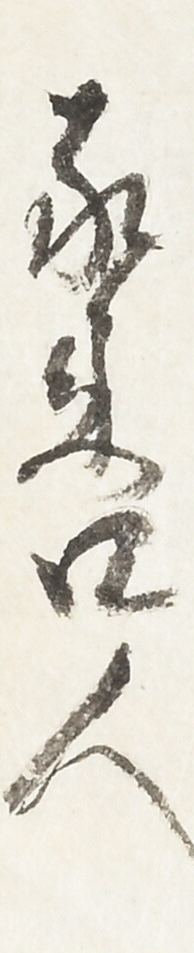家来四人
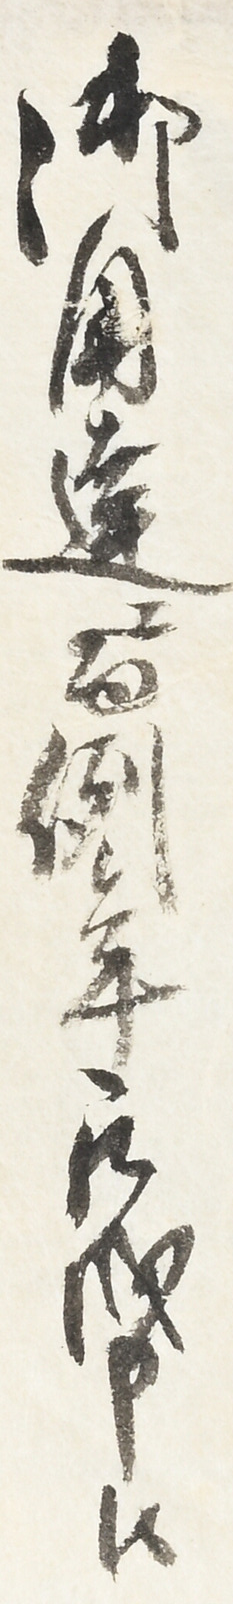御用達ニ而例年罷越申候

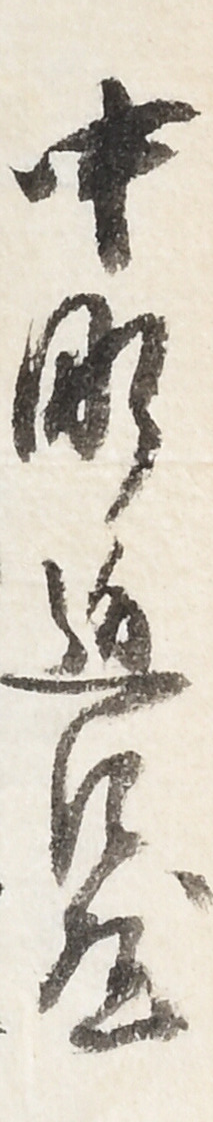中町近江屋
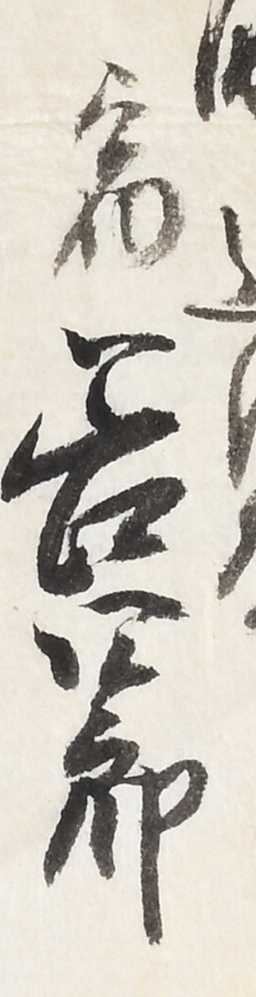宿善四郎
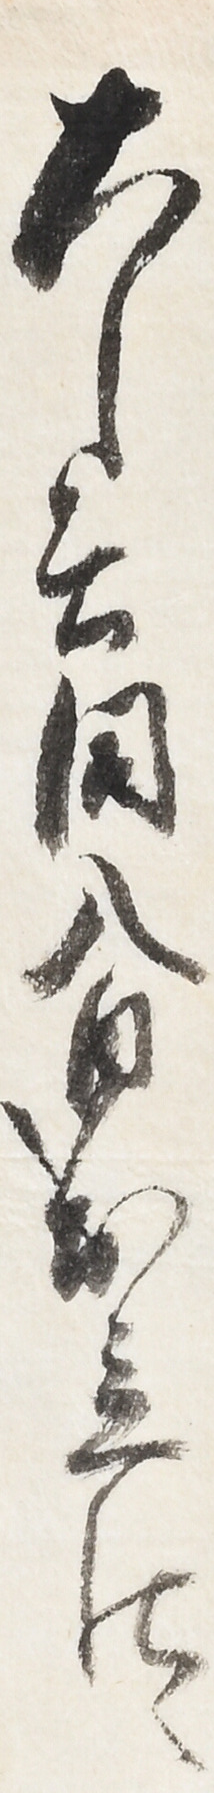右之者同八日出立仕候
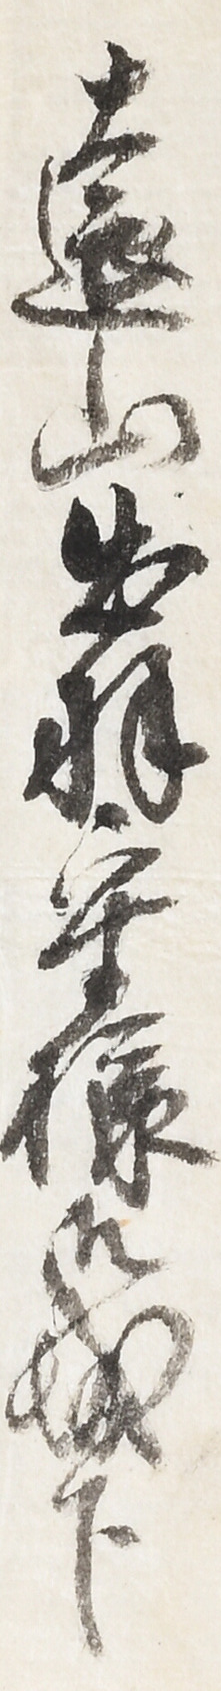遠山出羽守様御城下
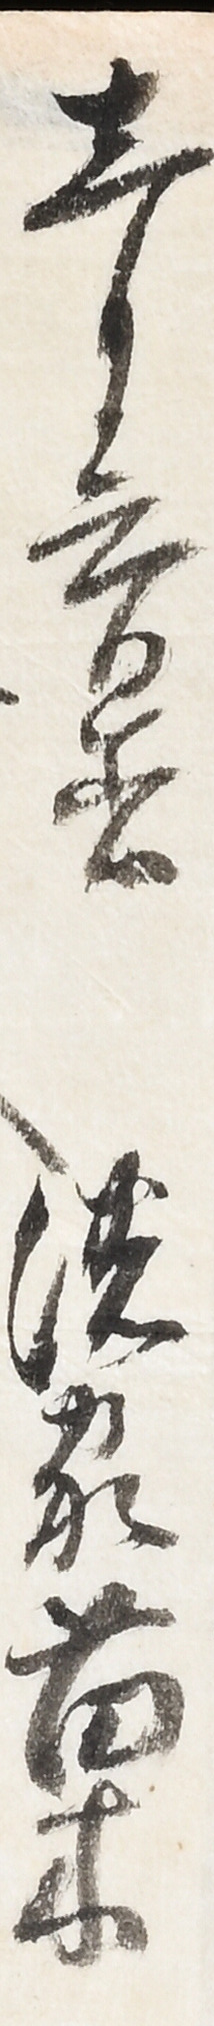十二月六日着濃州苗木
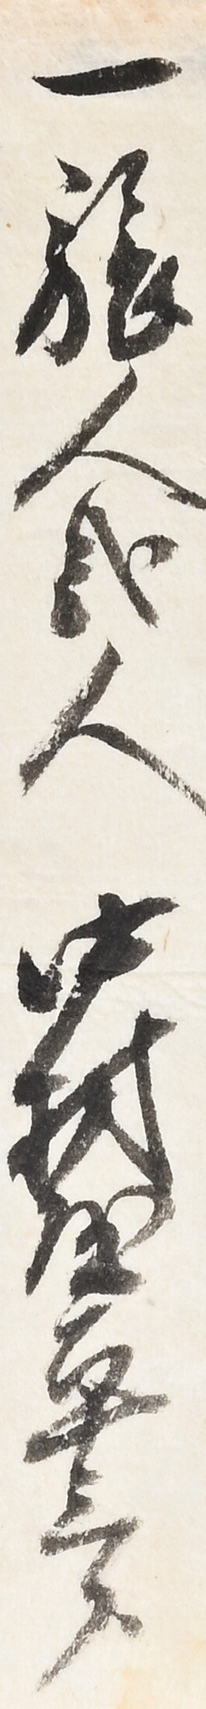一旅人弐人中村屋平三郎
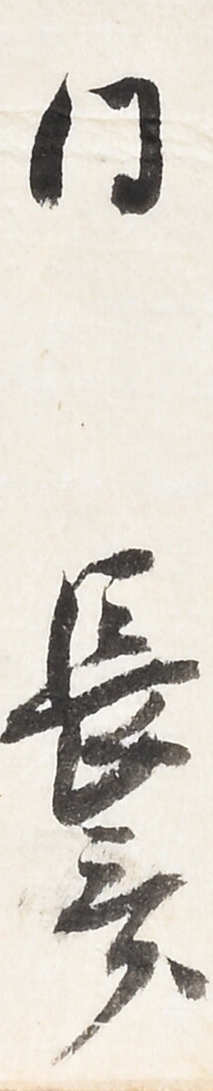同長三郎
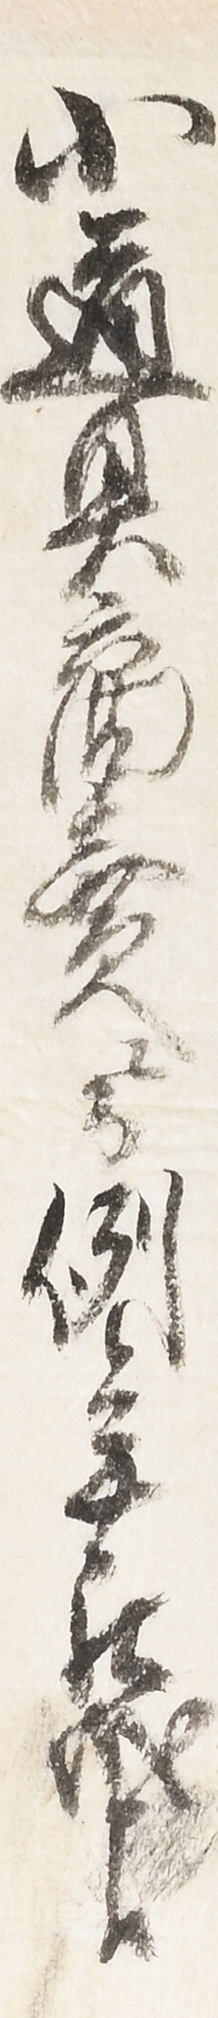小道具商売ニ而例年罷越申候
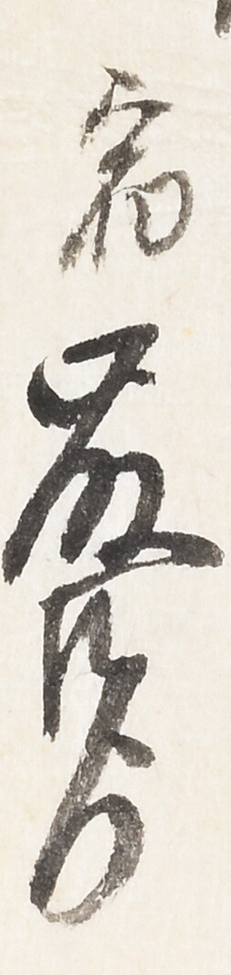宿籐左衛門
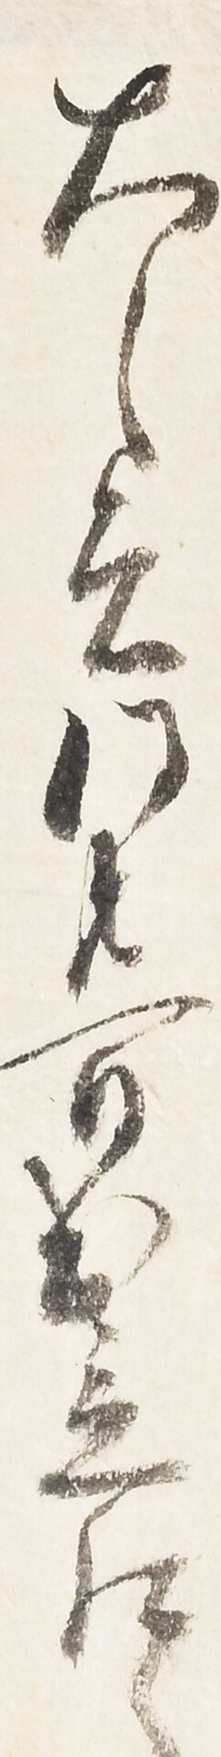右之者同八日出立仕候
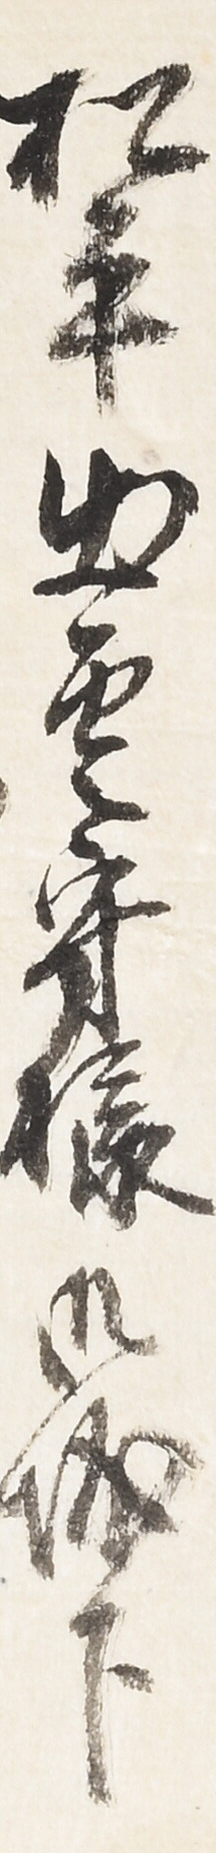松平出雲守様御城下
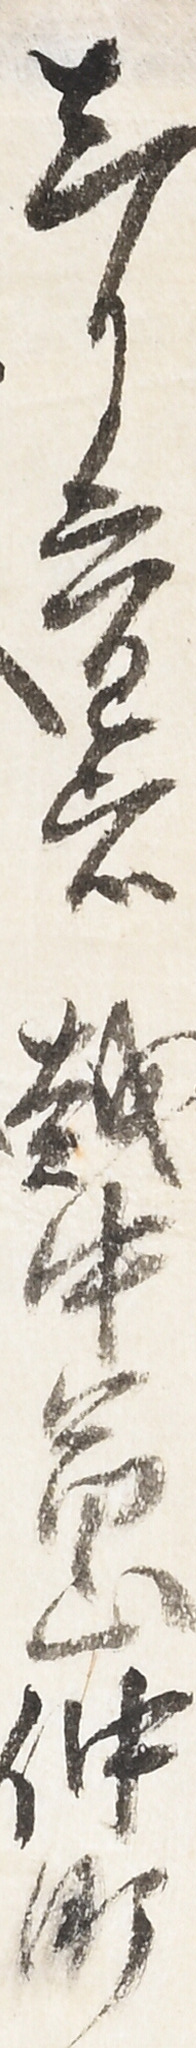十二月六日着越中富山仲町
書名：旅人泊控帳
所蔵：伊那市立高遠町図書館・合同会社AMANE
